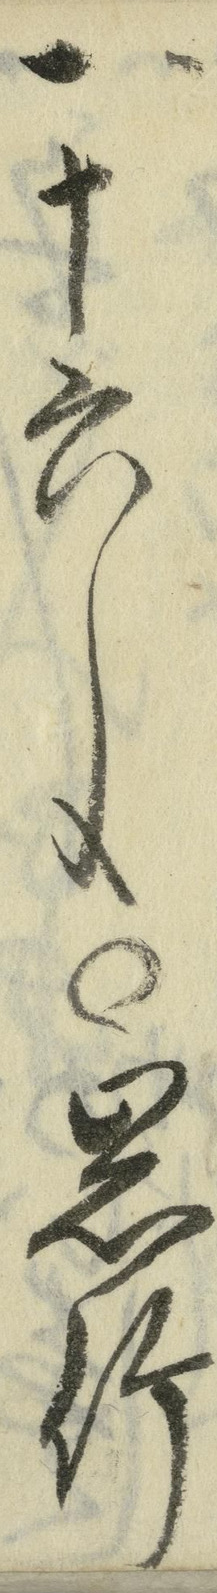一十六文黒竹
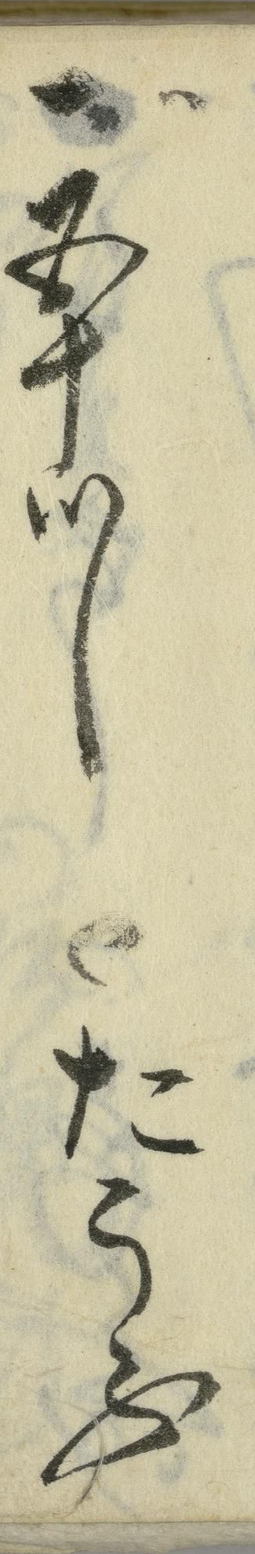一五十弐文たうふ
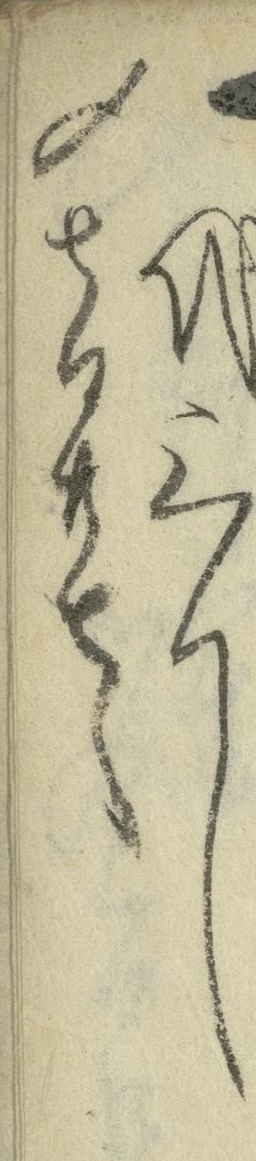〆七百廿七文又
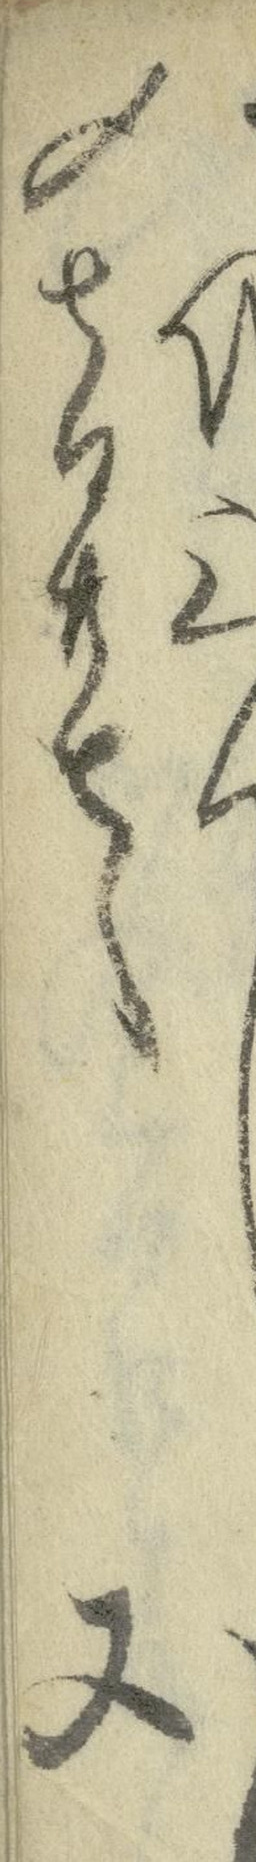〆七百廿七文又

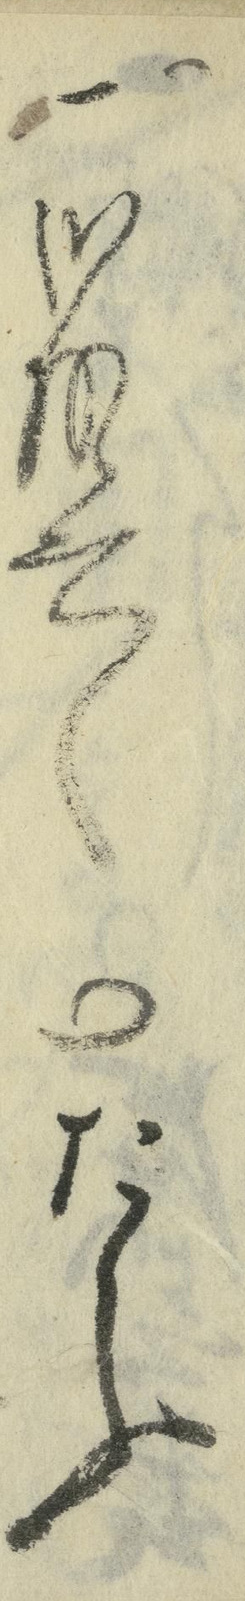一弐拾六文たうふ
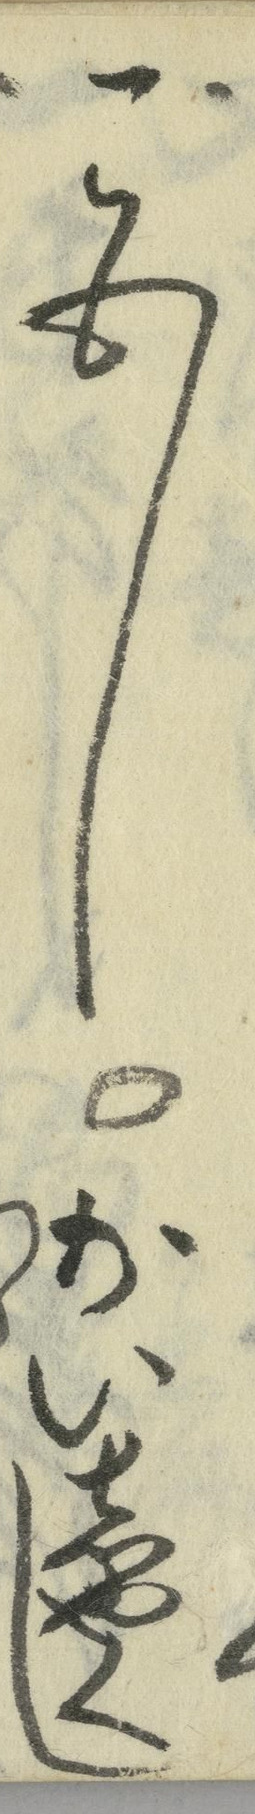一五文かいしやくし
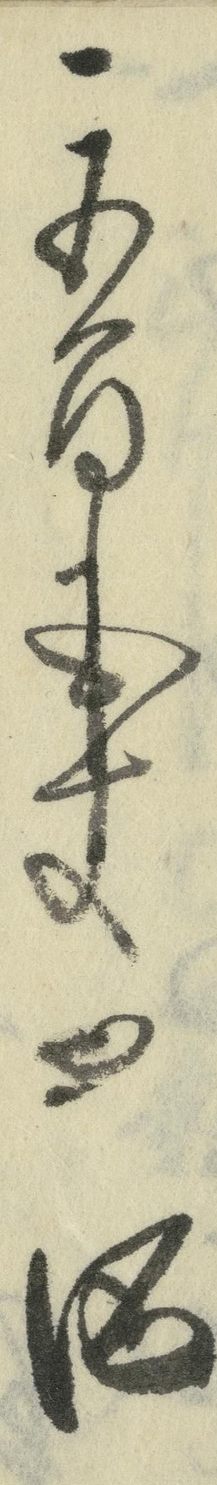一五百五十文酒
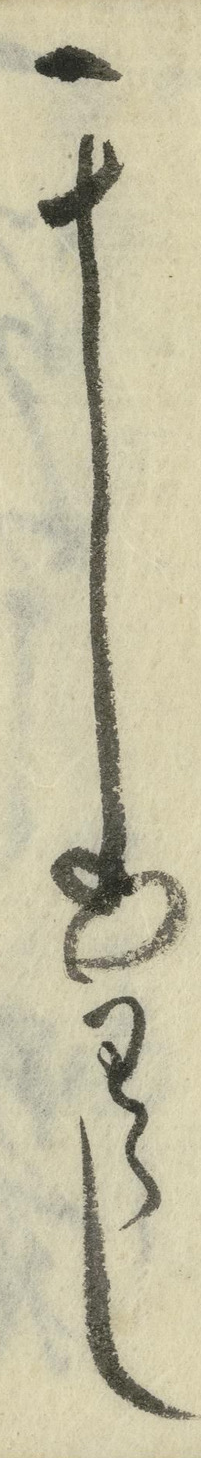一十文わらし
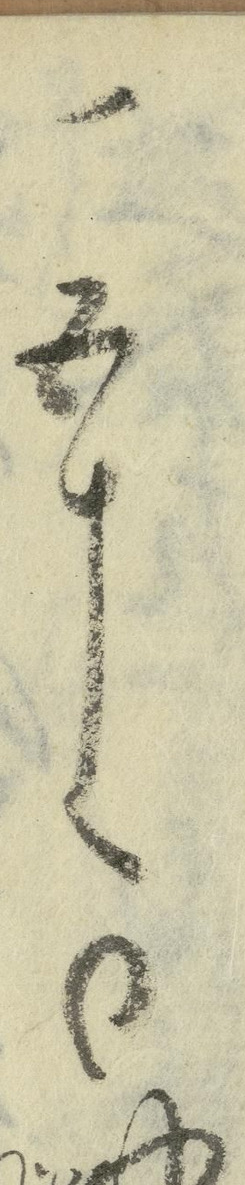一五十文中間
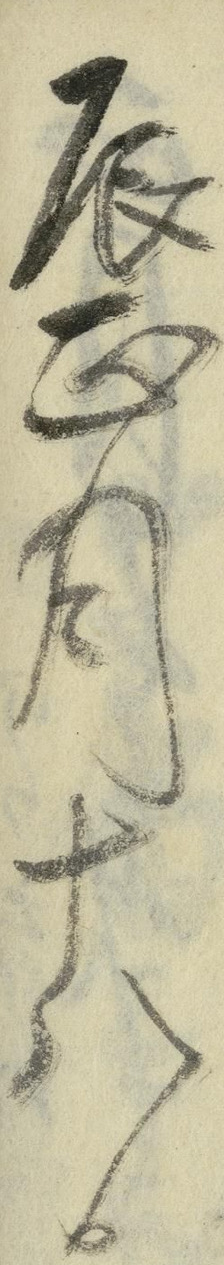辰正月十八日
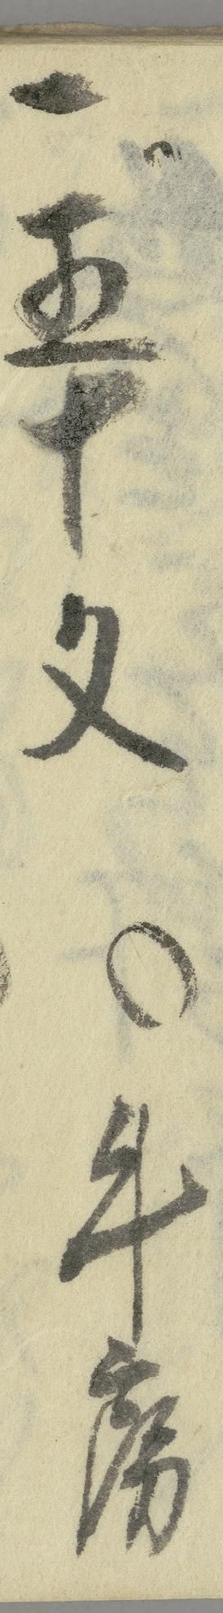一五十文中間

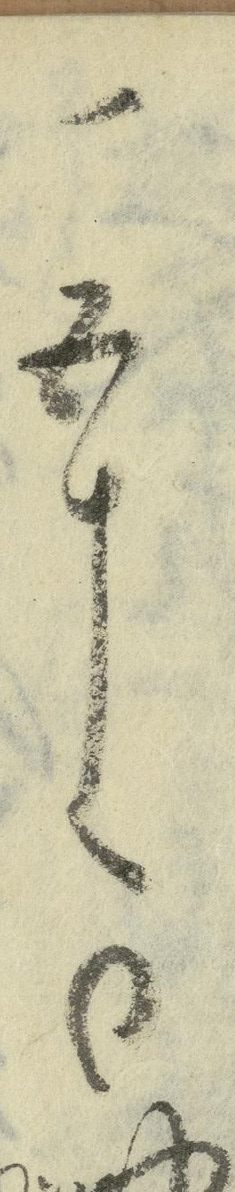一五十文牛旁
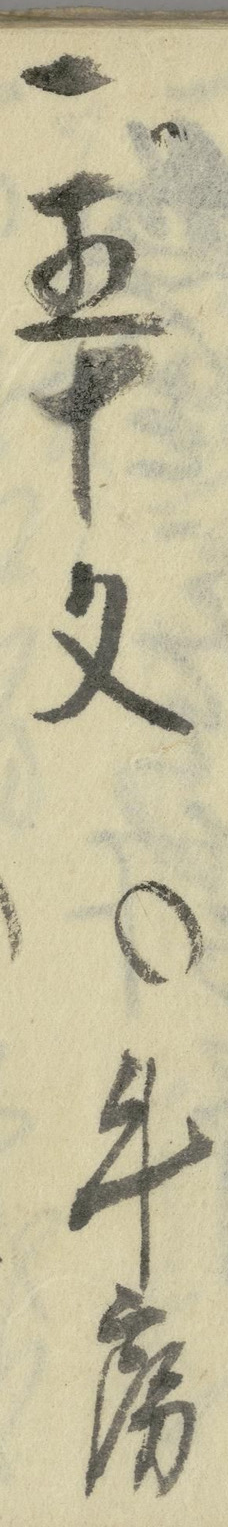一五十文牛旁
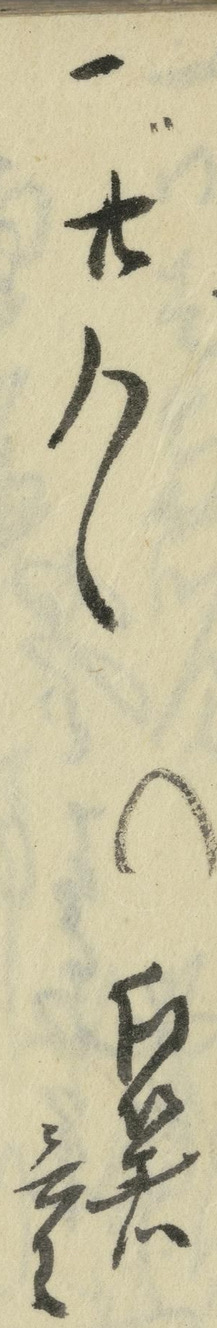一廿八文煮
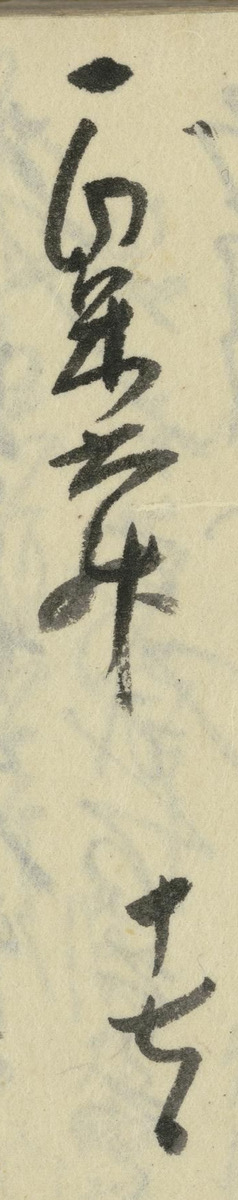一白米六升十七日
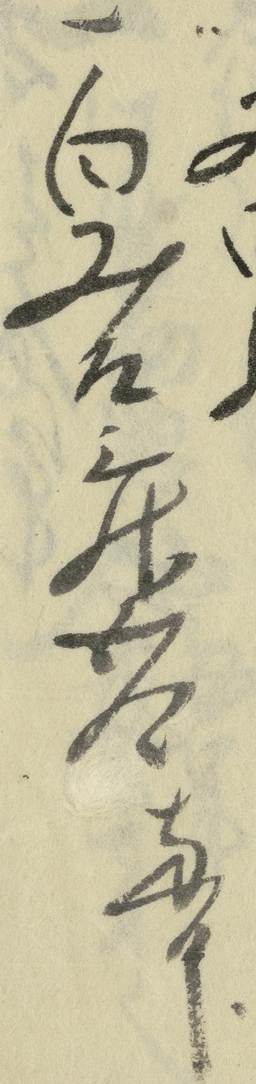一白みそ三升五合両日
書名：天明淺間噴火ニ関スル書類
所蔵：東京大学地震研究所図書室 Earthquake Research Institute Library, The University of Tokyo, JAPAN
